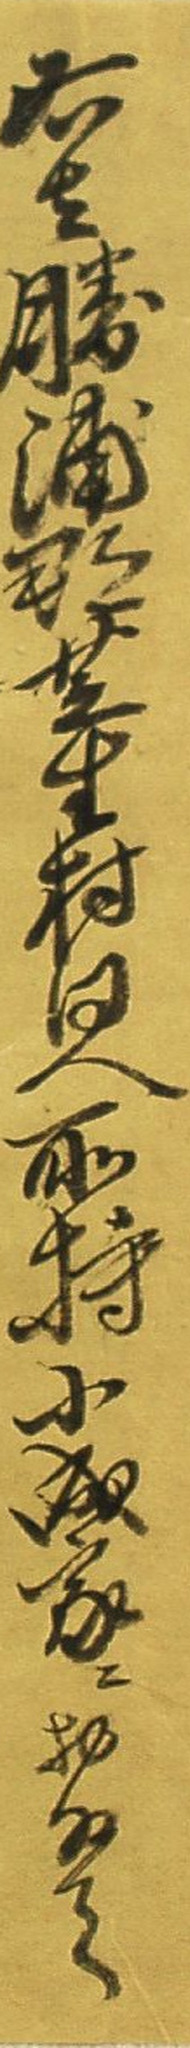右は勝浦郡芝生村同人所持小家におゐて
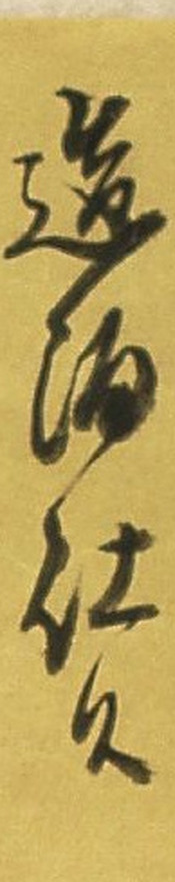造酒仕候
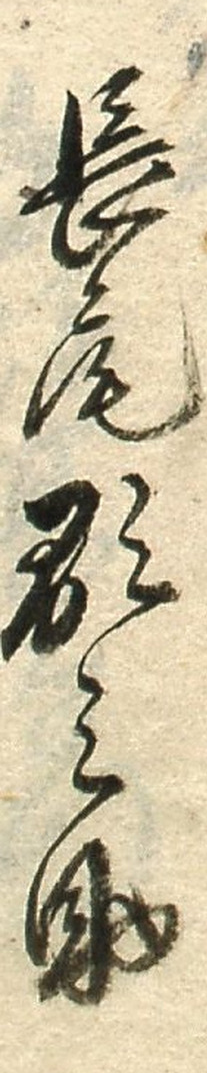長尾郡之助
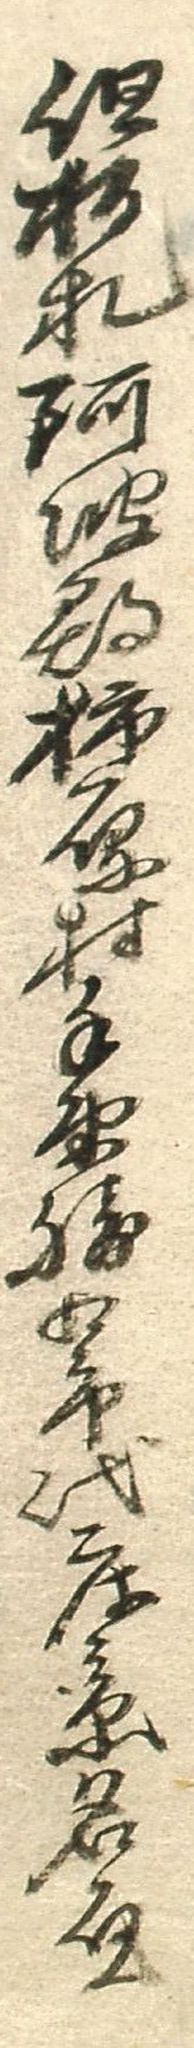但板札阿波郡柿原村手束勝五郎代庄兵衛名
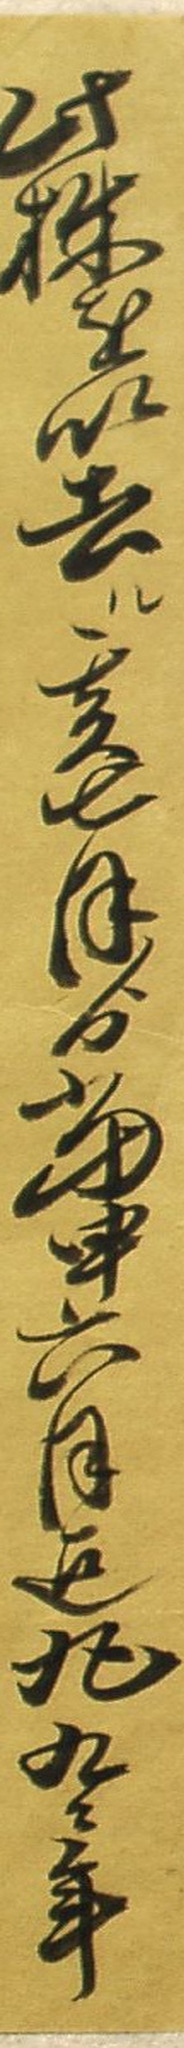此株を以去る亥七月より当申六月迄丸九ヶ年
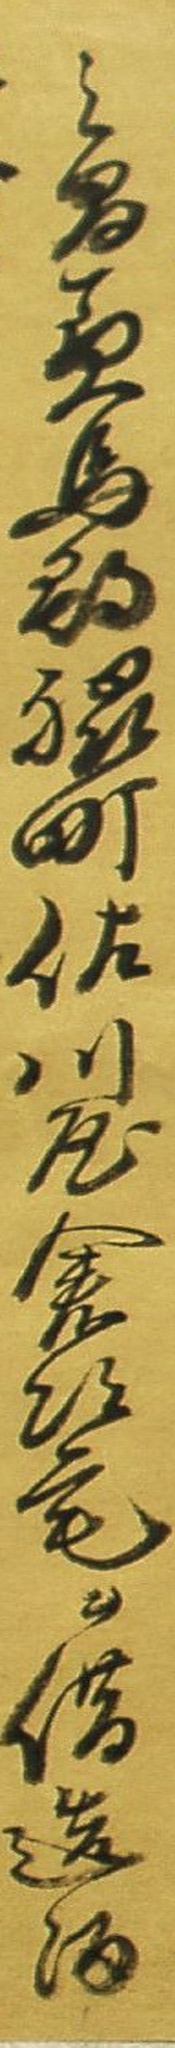之間美馬郡脇町佐川屋倉次宅を借造酒
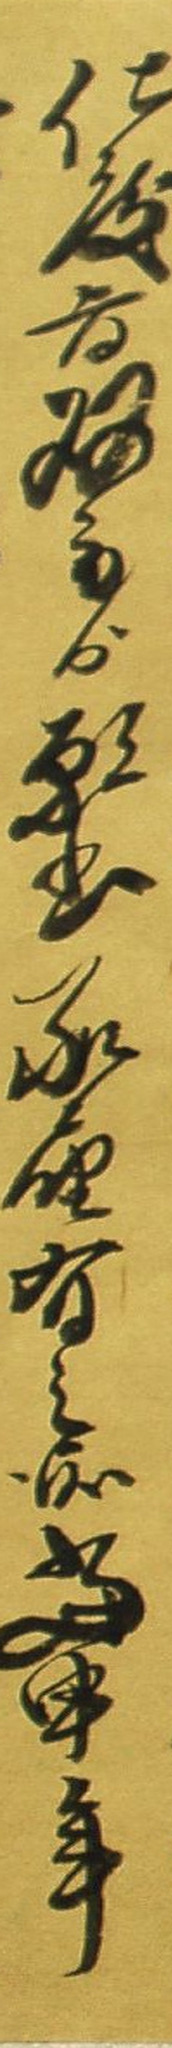仕度旨双方より願出承届有之候所当申年
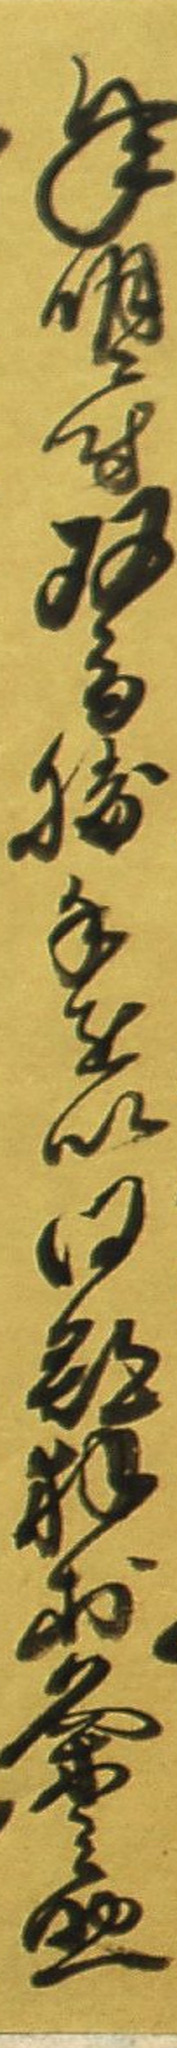年明に付双方勝手を以同郡拝村粂之助
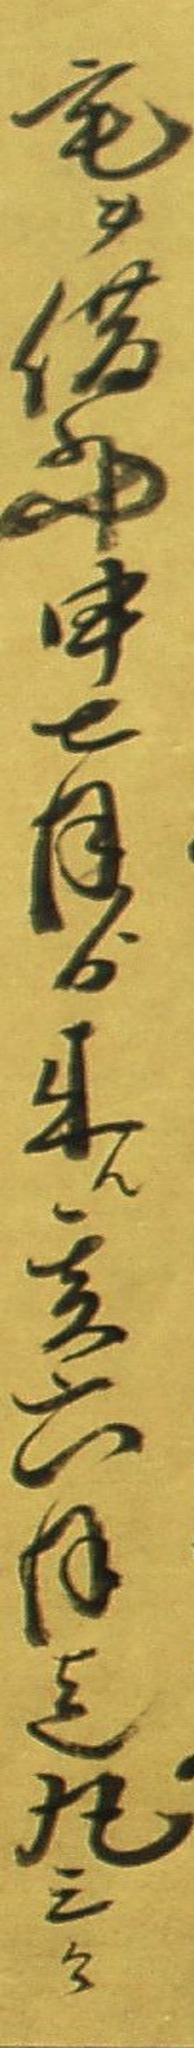宅を借当申七月より来る亥六月迄丸三ヶ
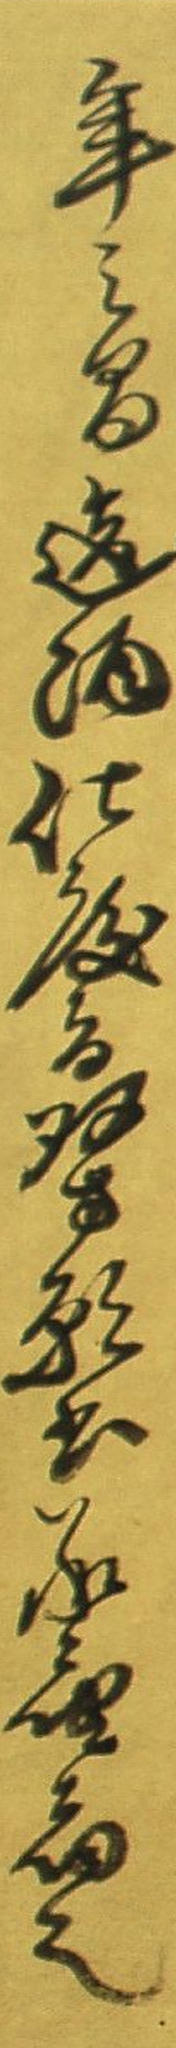年之間造酒仕度旨双方願出承届届也
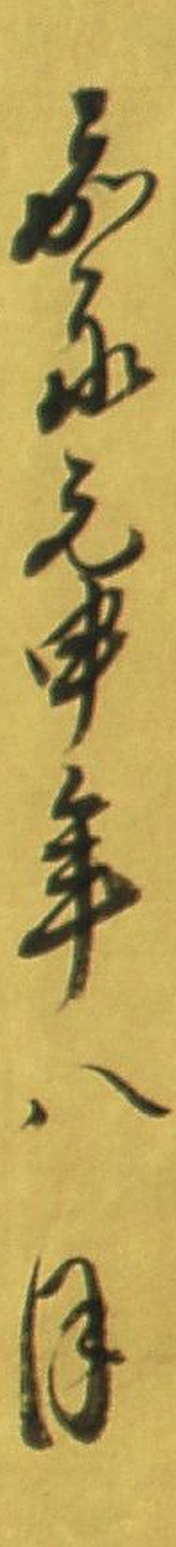嘉永元申年八月

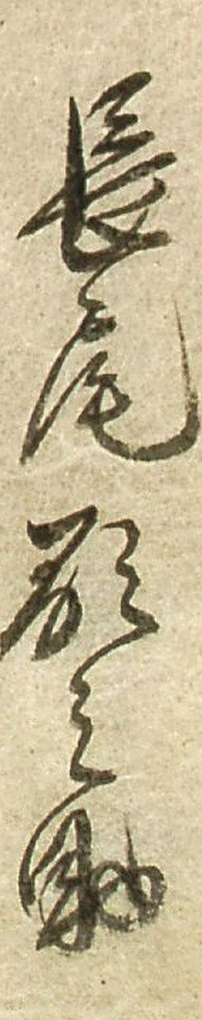長尾郡之助
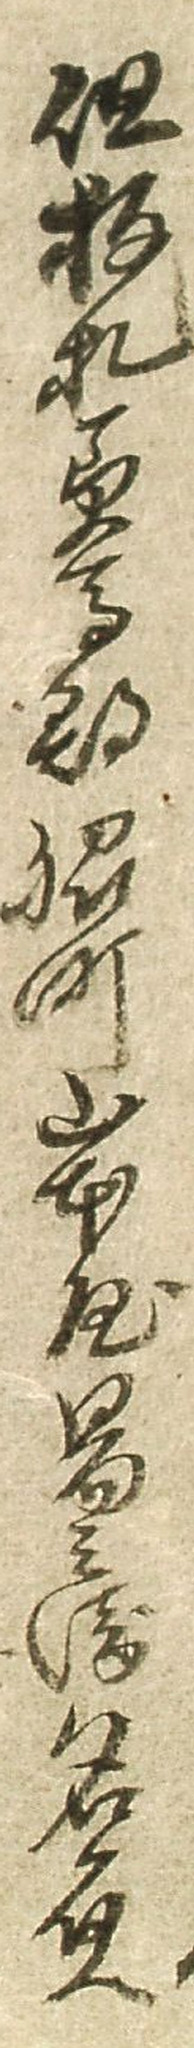但板札美馬郡脇町山本屋易兵衛名
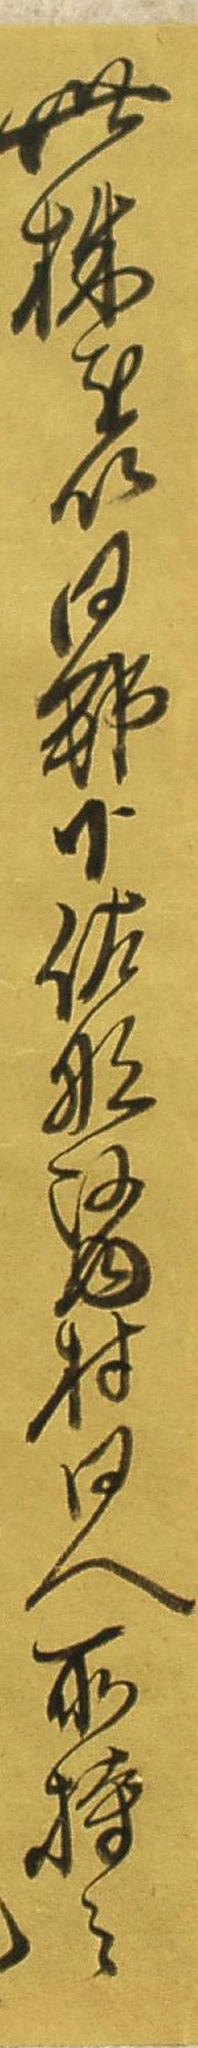此株を以同郡下佐那河内村同人所持之
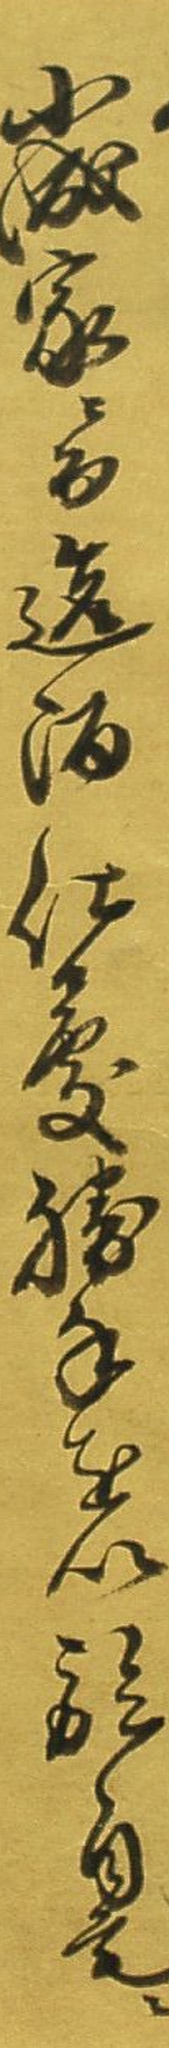小家ニ而造酒仕候処勝手を以於自宅に
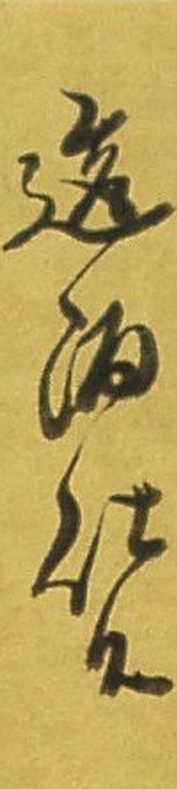造酒仕候
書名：名東郡中酒株並造酒屋軒数取調帳
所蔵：鳴門教育大学 Naruto University of Education
